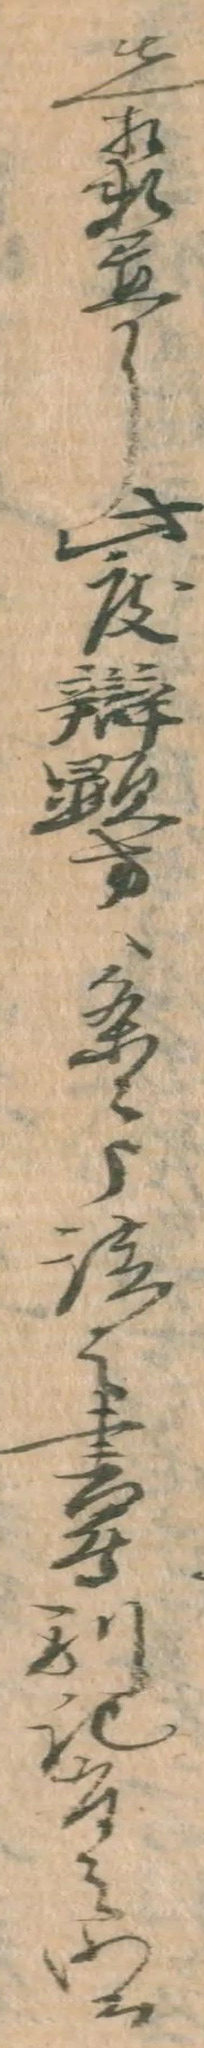先相頼置了此度辨顕方へ条々申談之書付別記有之仍而
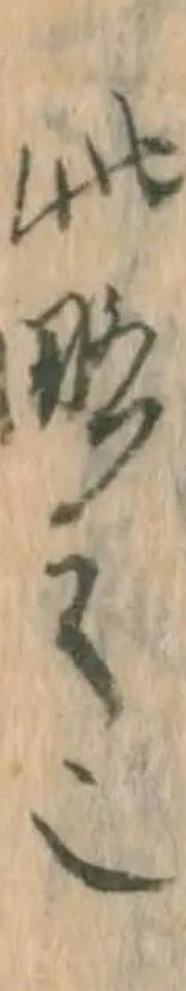此略之也
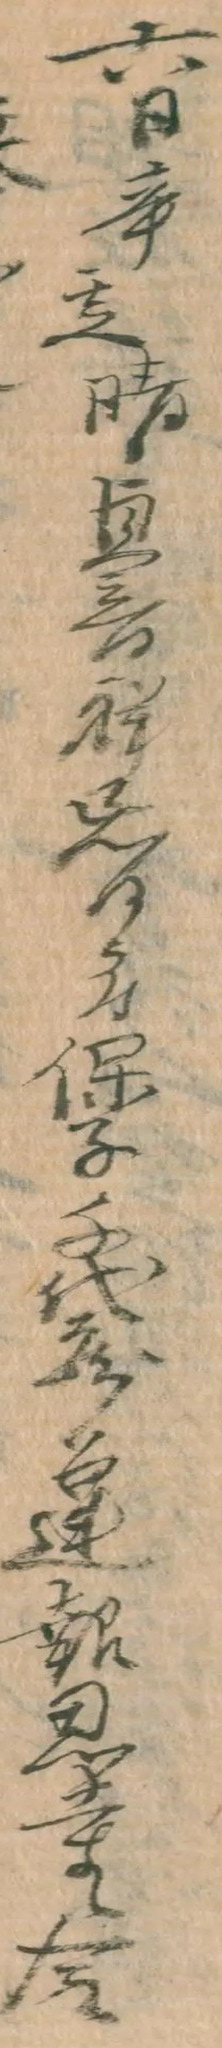六日辛亥晴貞音祥忌日ニ付保子千代蔵召連報恩寺へ令
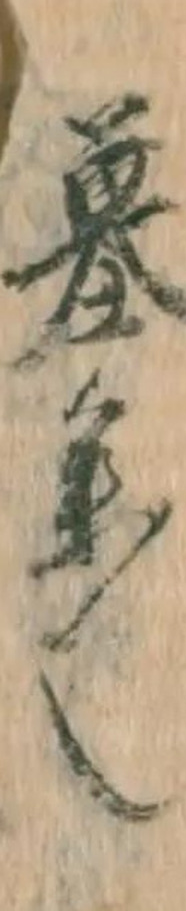墓参也
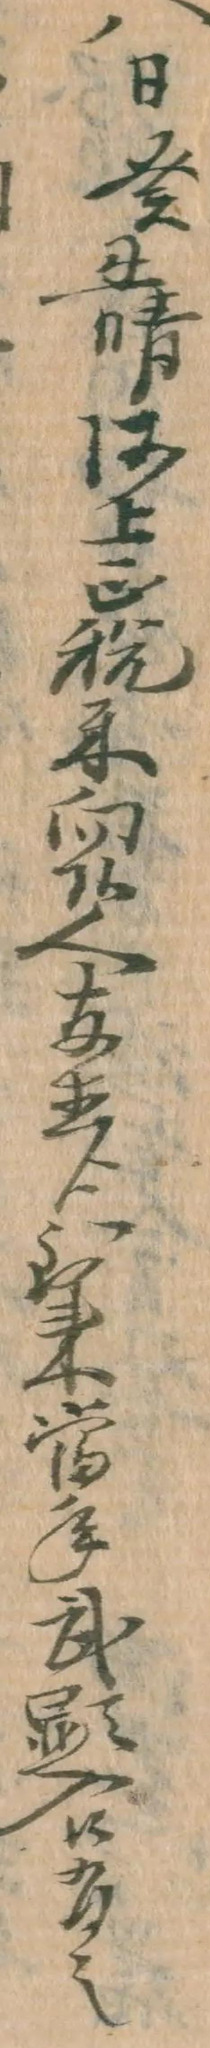八日癸巳晴河上正祝米向頭人友直ゟ到来當年武顕入江有之
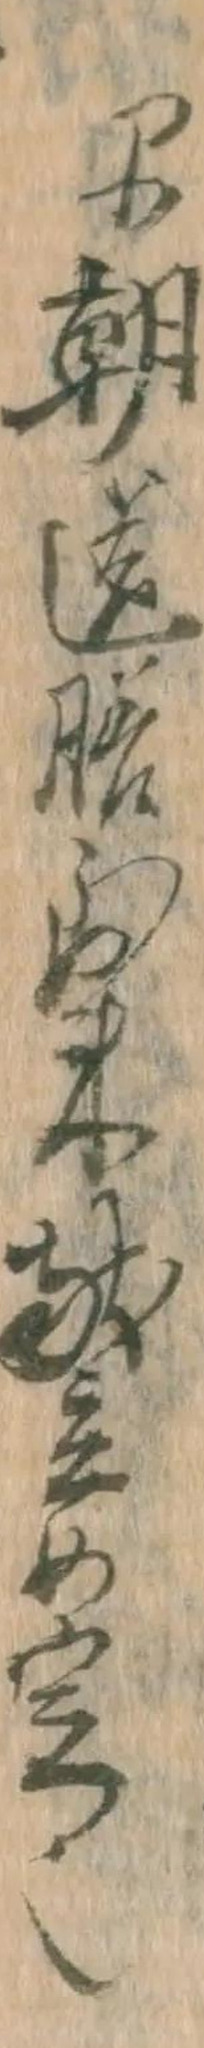早朝送膳到来献立如定也
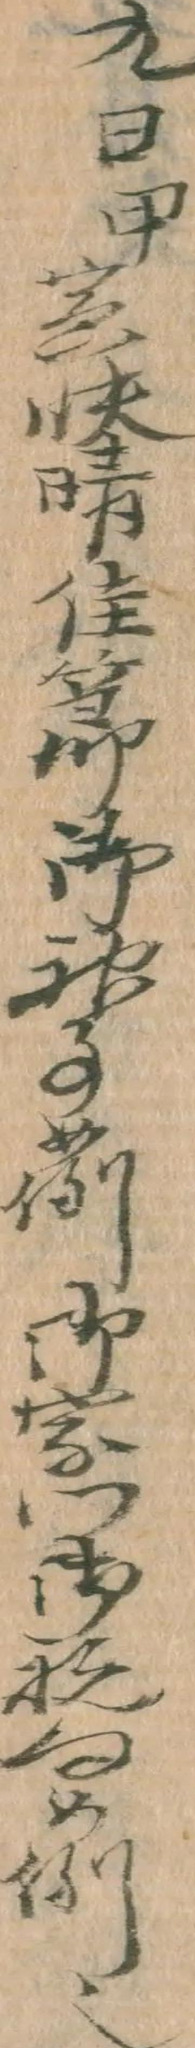九日甲寅快晴佳節御神事如例御家門御祝向如例也
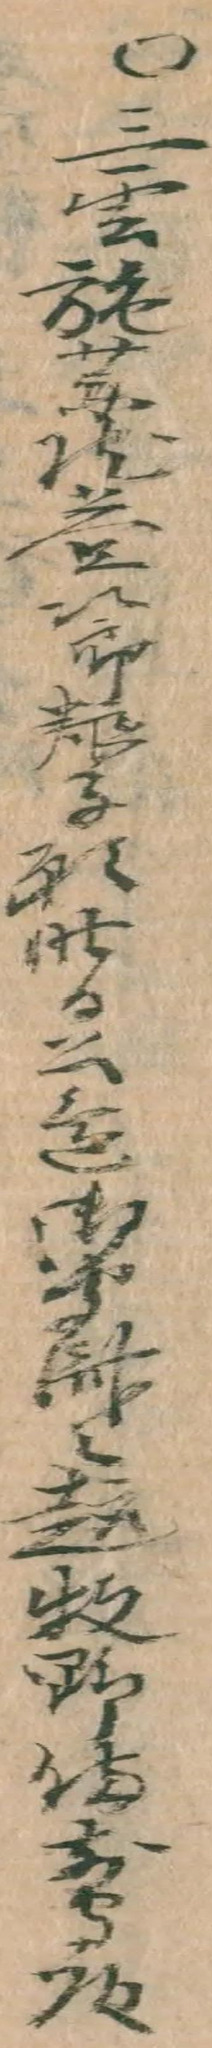○三雲施薬院益次郎養子願昨日公邊御聞済之趣牧野備前守殿
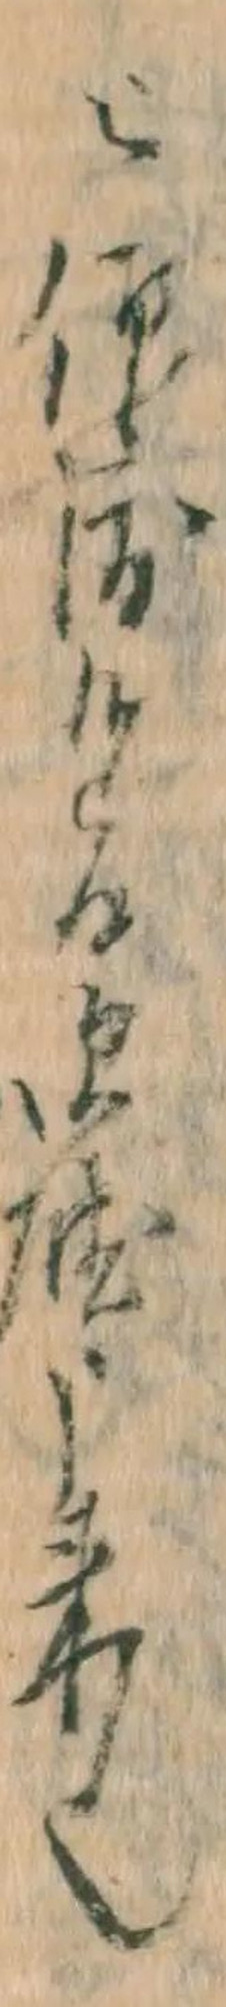被仰渡候旨吹聴申来也
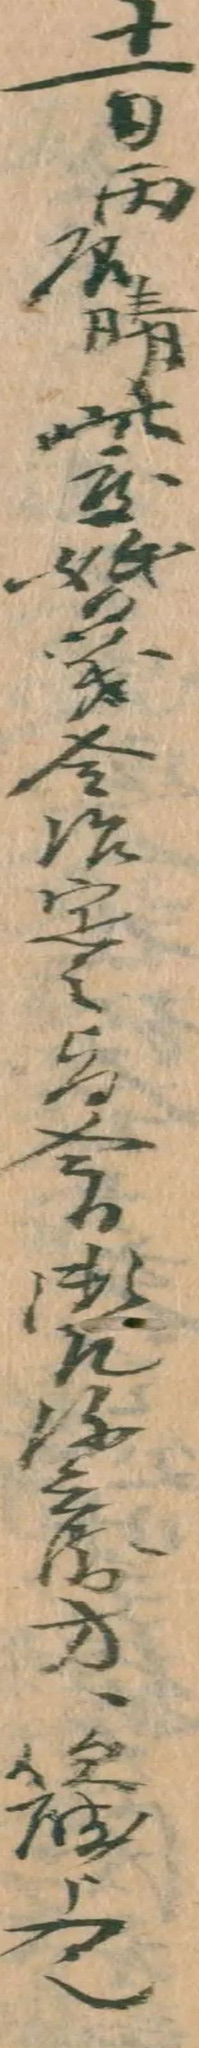十一日丙辰晴此度婚義令治定之旨今日瀬尾弥兵衛方へ吹聴申入也
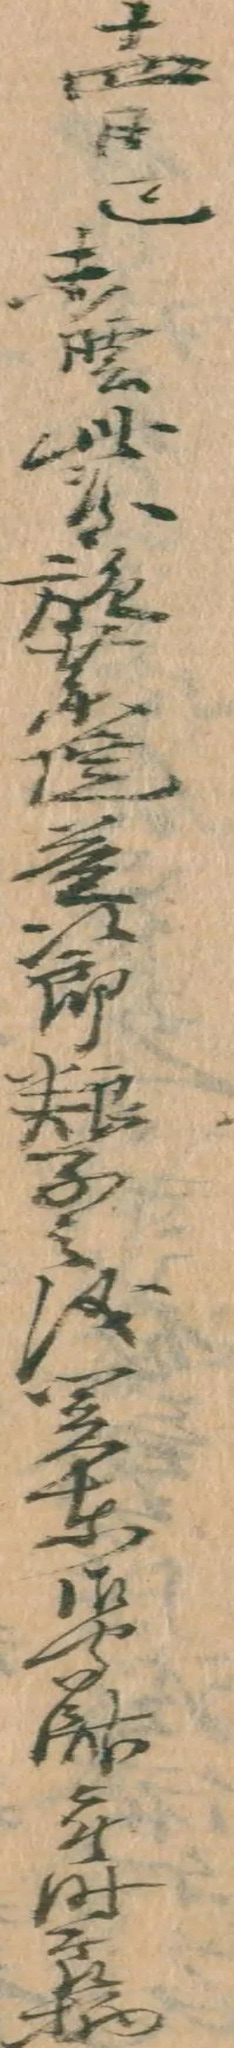十四日己未曇此度施薬院益次郎養子之儀関東御聞済ニ付時節柄
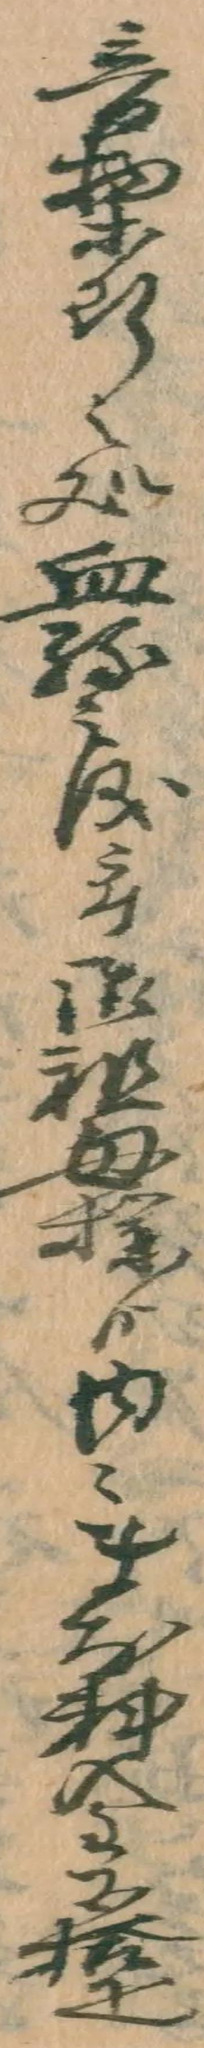音物等断之処血縁之儀二付御祖母様ゟ内々奉分料金五拾疋
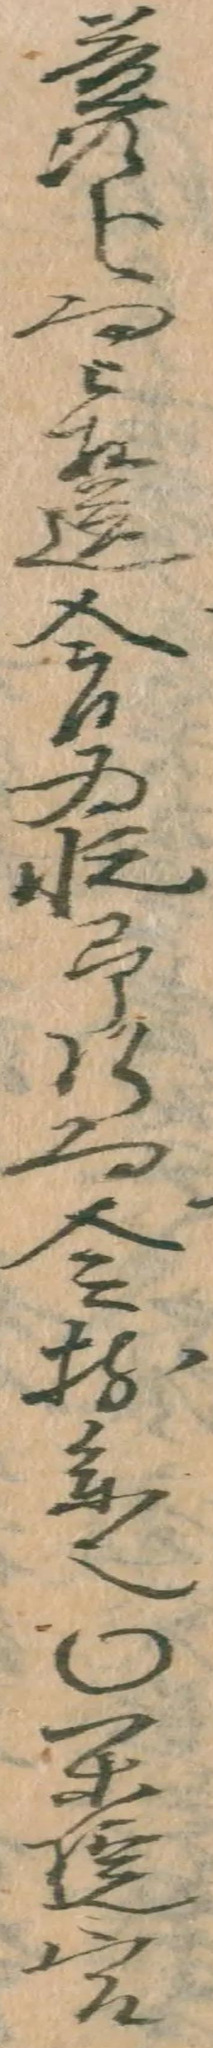藤次郎へ向被相送今為祝予行向令持参也○閑院宮
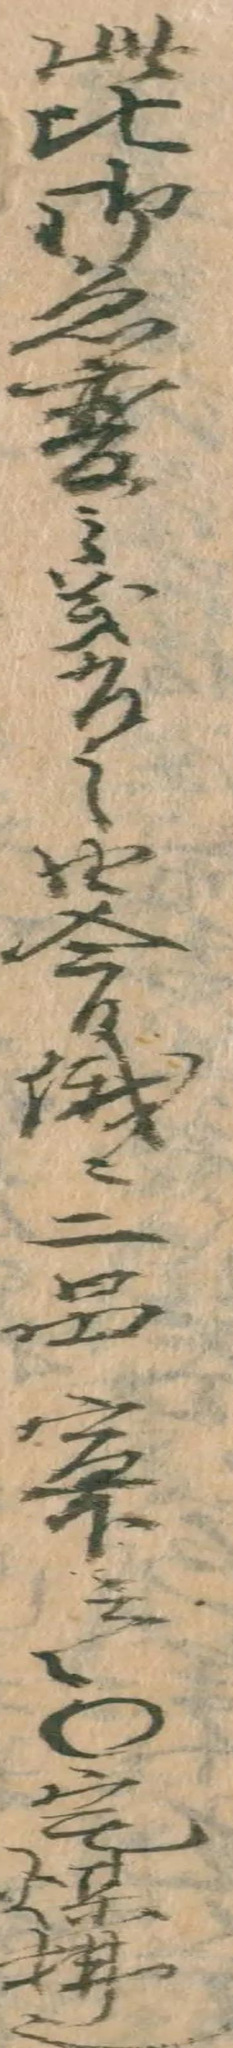此頃御急変之義有之由今日俄ニ二品宣下云々〇宅煤払也
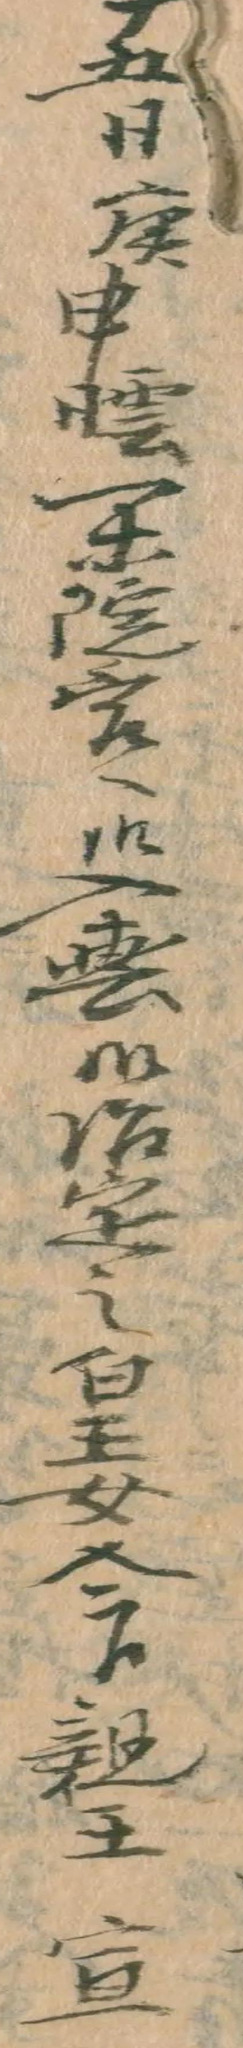十五日庚申曇閑院宮へ御入輿御治定之皇女今日親王宣
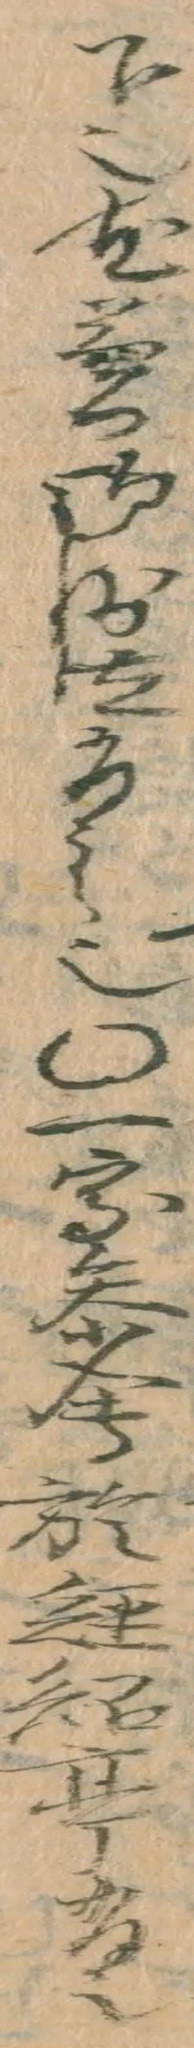下也尤兼日御沙汰有之也〇一家参會於経紹亭有之
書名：賀茂社記録. 第69冊
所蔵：国立国会図書館 National Diet Library, JAPAN
